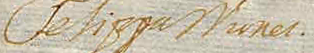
Felippa Nunes.
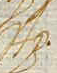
Ap.
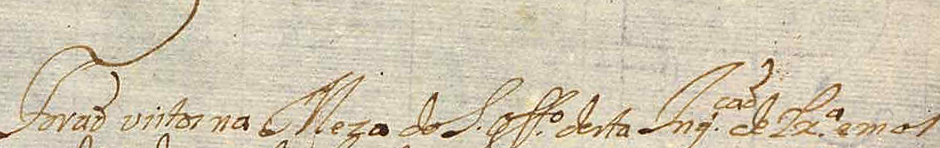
Foraõ vistos na Meza do S. off.o desta Inq.çaõ de Lx.a em os
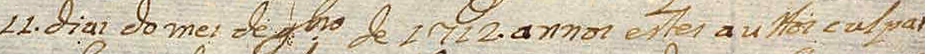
11. dias do mes de 9.bro de 1712. annos estes auttos culpas
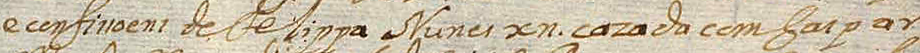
e confissoens de Felippa Nunes xn. cazada com Gaspar
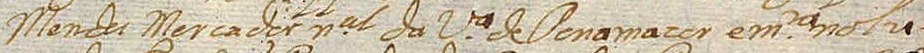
Mendes Mercador n.al da V.a de Penamacor e mra no Lu
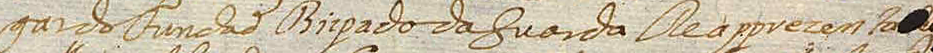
gar do Fundaõ Bispado da Guarda Re apprezenta_
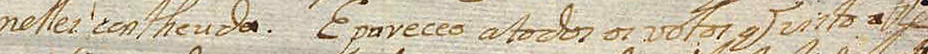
nelles contheudo. E pareceo a todos os votos q̄ uisto a Re
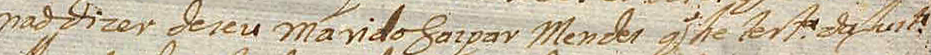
naõ dizer de seu marido Gaspar Mendes q̄ he test.a da Just.a
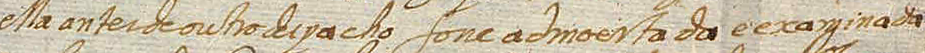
ella antes de outro despacho fosse admoestada e examinada
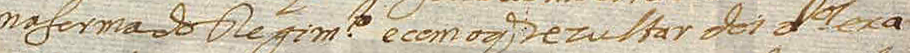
na forma do Regim.to e com o q̄ rezultar dos dos exa
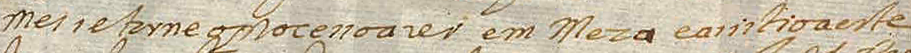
mes se torne o processo a ver em Meza e assistio a este
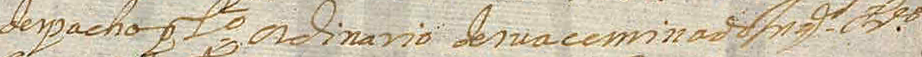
despacho pl.o ordinario de sua cominado Inq.r Fr.co
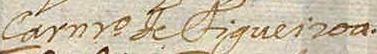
Carnr.o de Figueiroa
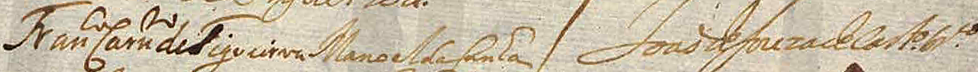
Franco Carnro de Figueiroa Manoel da Cunha / Joaõ de Souza de Cast.o br.co
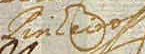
Pinheiro
